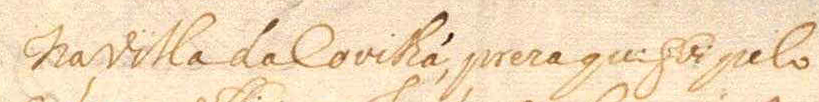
na villa da Covilhã, preza que foi pelo
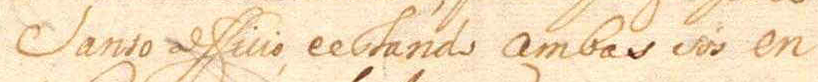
Santo officio, e estando ambas sós en
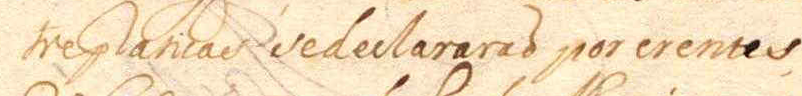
tre pRaticas se declararaõ por crentes,
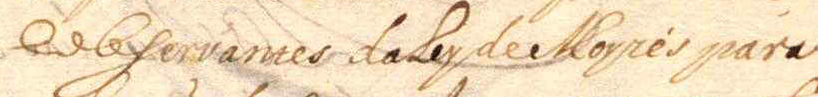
E observantes da Ley de Moyzés para
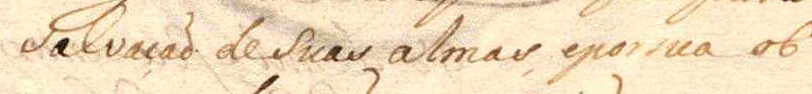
salvaçaõ de suas almas, e por sua ob
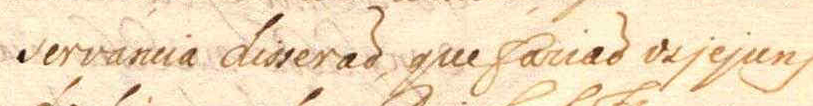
servancia disseraõ, que faziaõ os jejuns
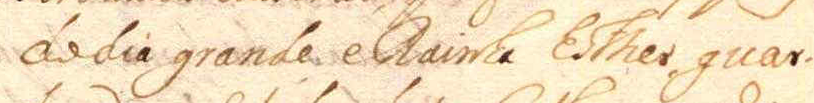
do dia grande, e Rainha Esther, guar
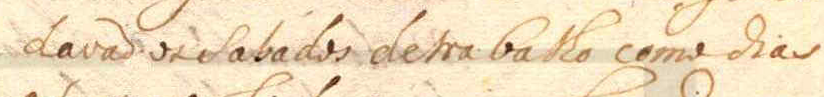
davaõ os Sabados de trabalho como dias
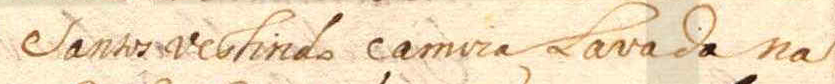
Santos, vestindo camiza Lavada na
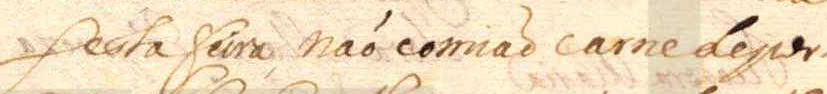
sesta feira, naõ comiaõ carne de por
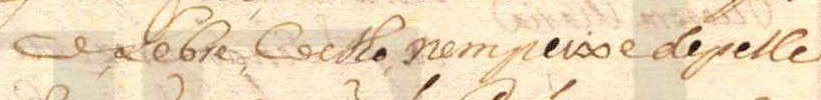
e, Lebre, Coelho, nem peixe de pelle
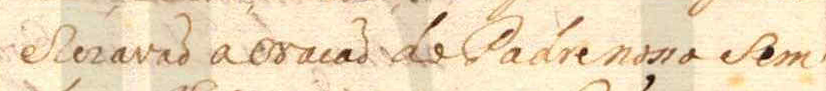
e Rezavaõ a oraçaõ do Padre nosso Sem
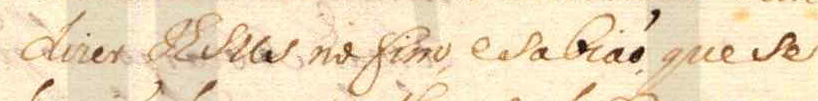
dizer IEsus no fim, e sabiaõ, que se
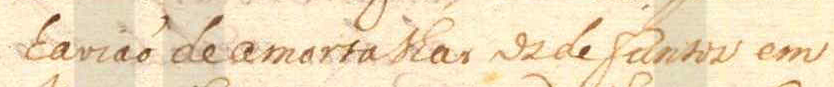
haviaõ de amortalhar os defuntoz em
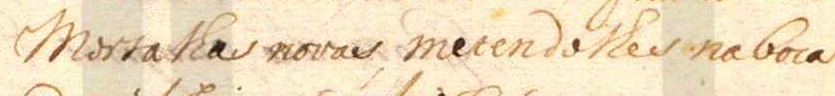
Mortalhas novas, metendolhes na boca
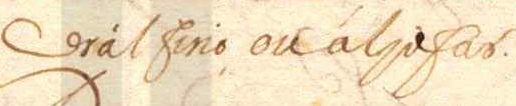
corál fino, ou aljofar.
